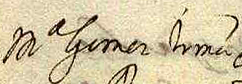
Ma Gomez Irmā
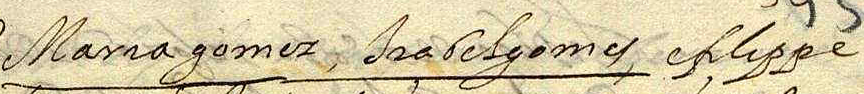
Maria gomez, Izabel gomes, e filippe
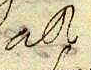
a R
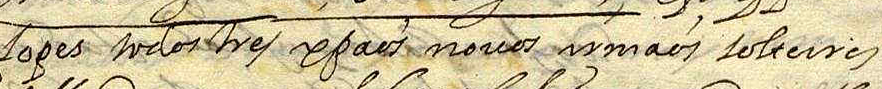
lopes todos tres xpaõs nouos irmaõs solteiroz
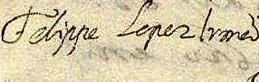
Felippe Lopez Irmaõ
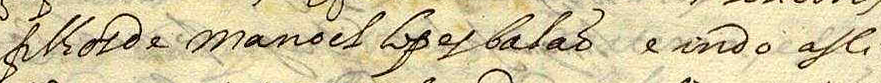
filhos de manoel lopes balaõ, e indo assi
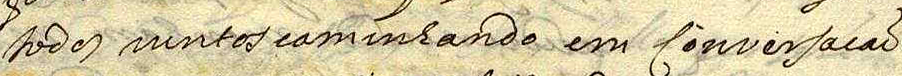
todos iuntos caminhando em Conversaçaõ
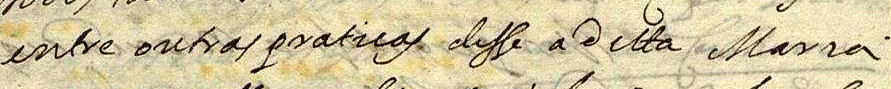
entre outras praticas disse a ditta Maria
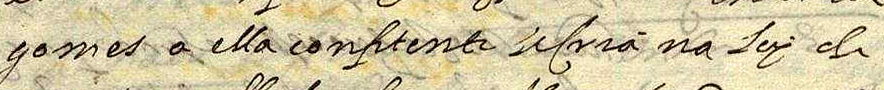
gomes a ella confitente se Cria na Ley de
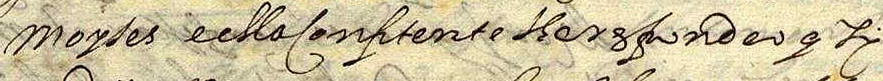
moyses e ella Confitente lhe respondeo q̄ sy
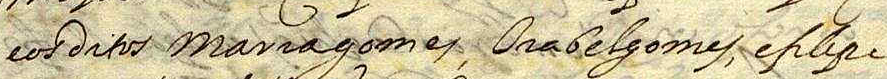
e os ditos maria gomes, Izabel gomes, e filipe
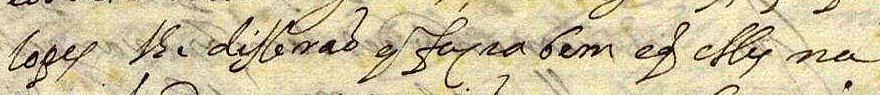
lopes, lhe disseraõ q̄ fazia bem e q̄ elles na
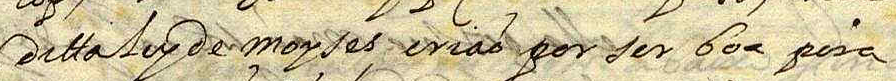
ditta Ley de moyses criaõ por ser boa pera
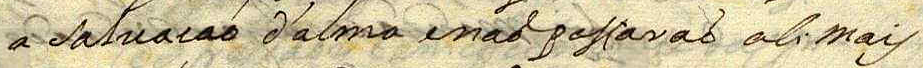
a saluaçaõ d'alma e naõ passaraõ ali mais
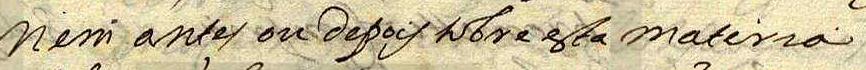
nem antes ou depois sobre esta materia
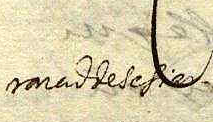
razaõ de se fiar.
